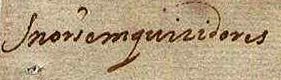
Snors̄ emquizidores
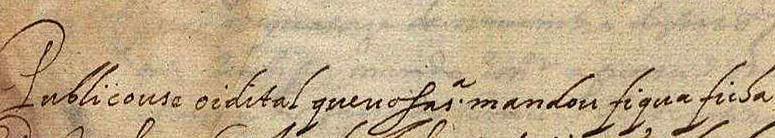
Publicouse o idital que uosa s.a mandou fiqua ficha
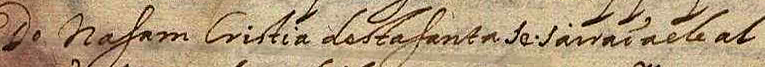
do na samCristia desta santa Se. Sairaõ a ele al
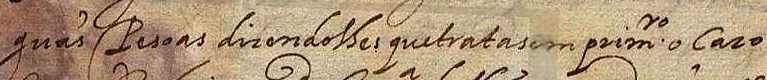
guās Pesoas dizendolhes que tratasem prim.ro o Cazo
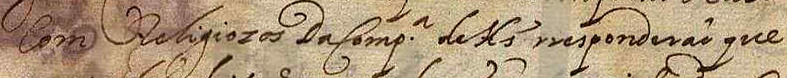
Com Religiozos Da Comp.a de Hs̄ rresponderaõ que
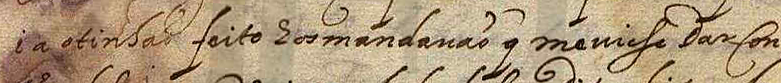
ia o tinhaõ feito E os mandauaõ q̄ me uiese Dar Con
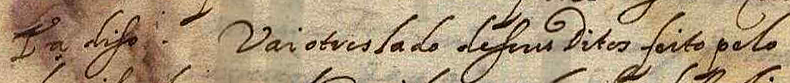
ta diso. Vai o treslado de seus ditos feito pelo
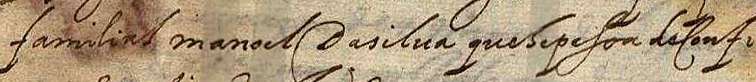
familial manoel Da silua que he pesoa de Confi
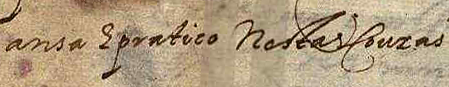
ansa E pratico Nesta Couzas
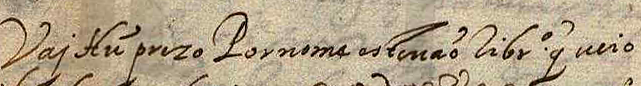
Vaj Hū prezo Por nome esteuaõ Ribr.o q̄ ueio
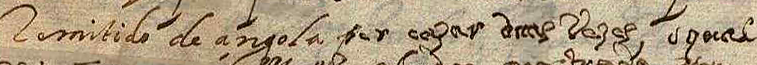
Remitido de angola por cazar duas Vezes, o qual
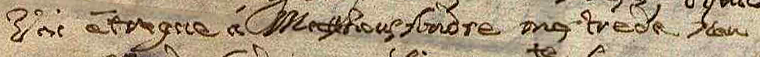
Vai ētrgue á Mattheus Andre mestre da nau
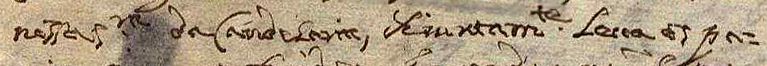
nossa s.ra da Candelaria, & iuntamte. leua os pa
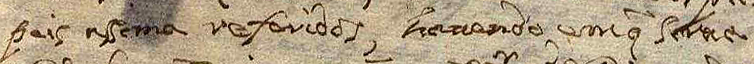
peis assima referidos, hauendo em q̄ seruir
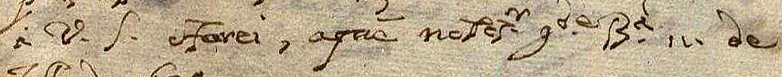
a V. S. o farei, a quē nosso s.r g.de B.a 11. de
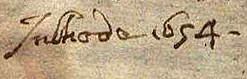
Julho de 1654.
